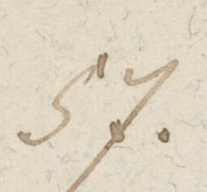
57.
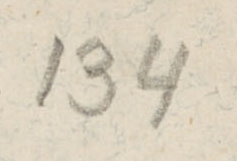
134
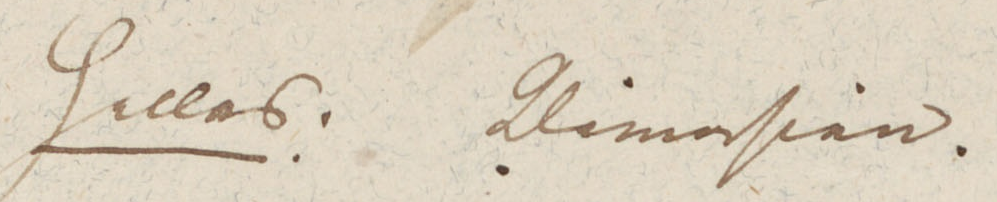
Hellas. Kleinasien.
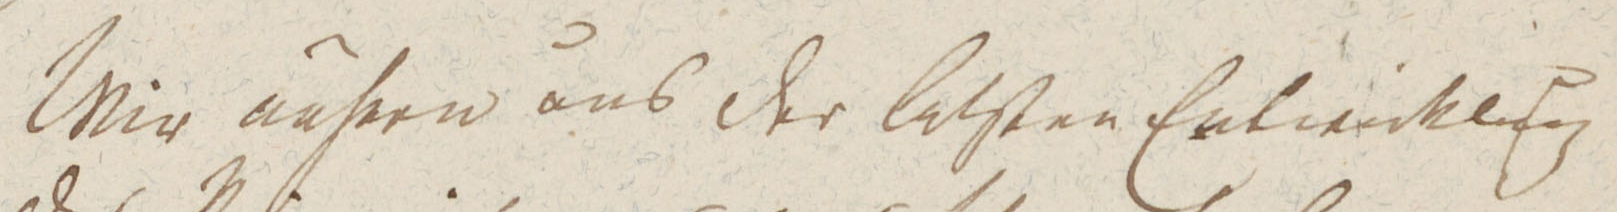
Wir nähern uns der letzten Entwicklung
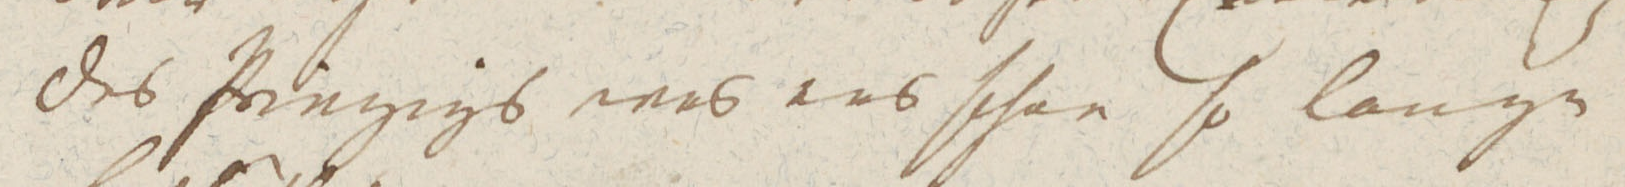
des Prinzips was uns shcon so lange
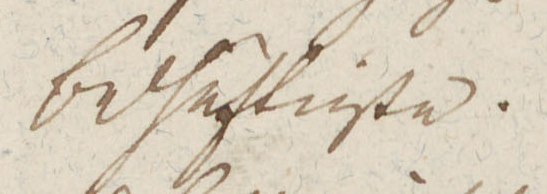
beschäftigte.
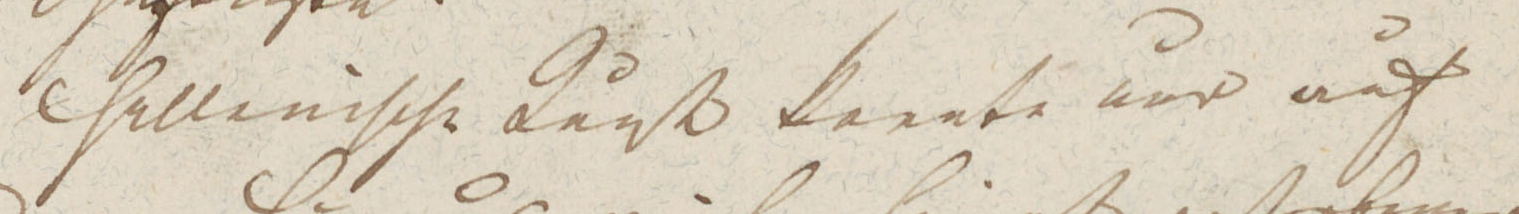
Hellenische Kunst konnte nur auf
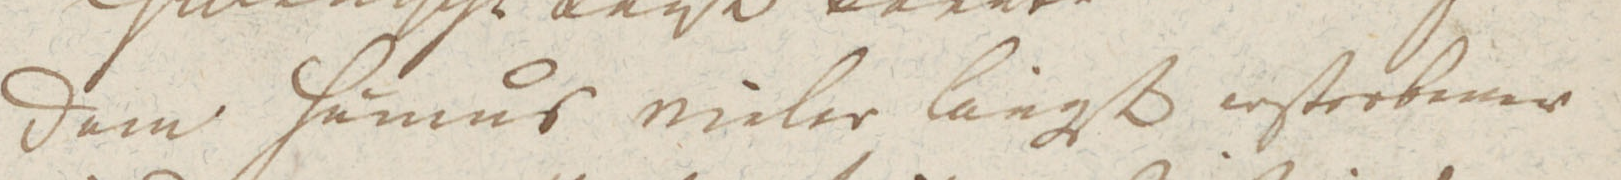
dem Humus vieler längst erstorbener
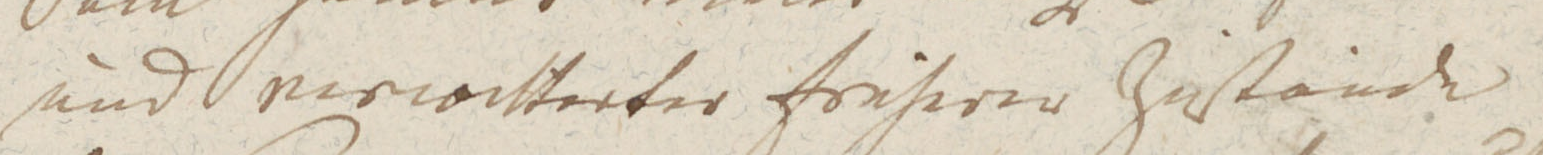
und verwitterter früherer Zustände
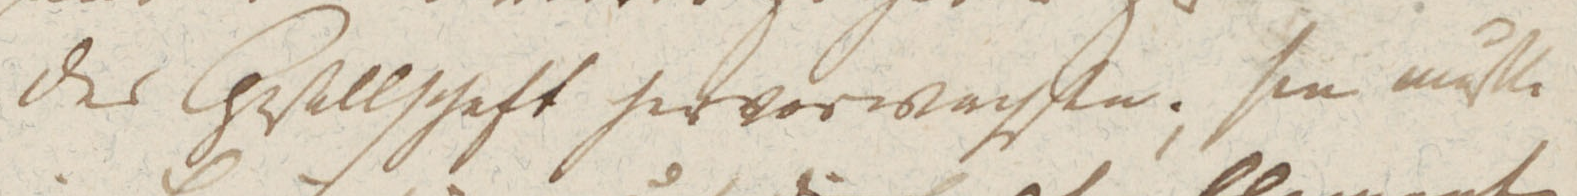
der Gesellschaft hervorwachsen; sie musste
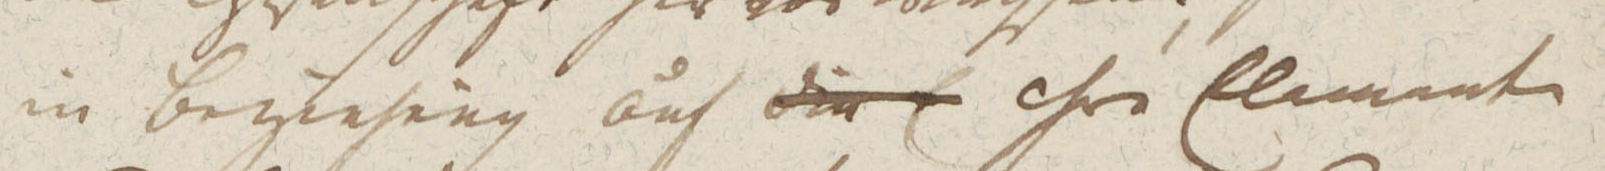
in Beziehung auf die E ihre Elemente
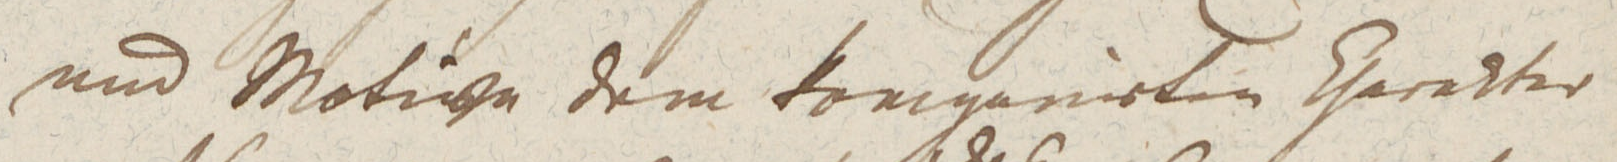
und Motive dem komponirten Charakter
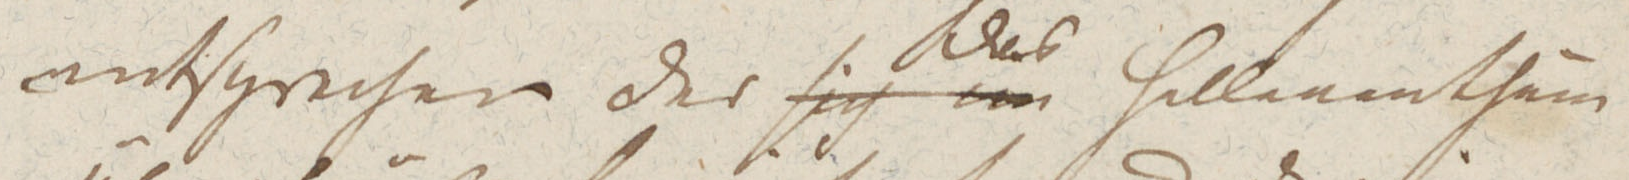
entsprechen der sich im das Hellenenthum
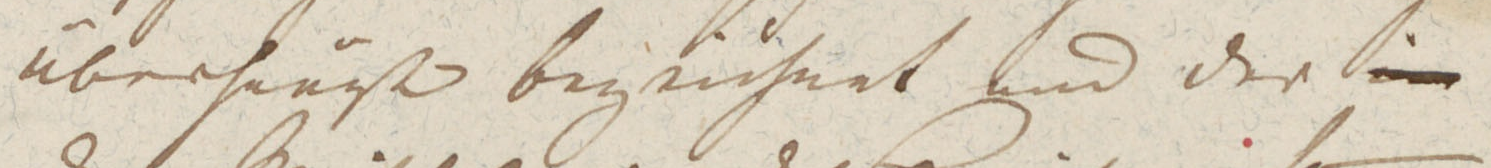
überhaupt bezeichnet und der im
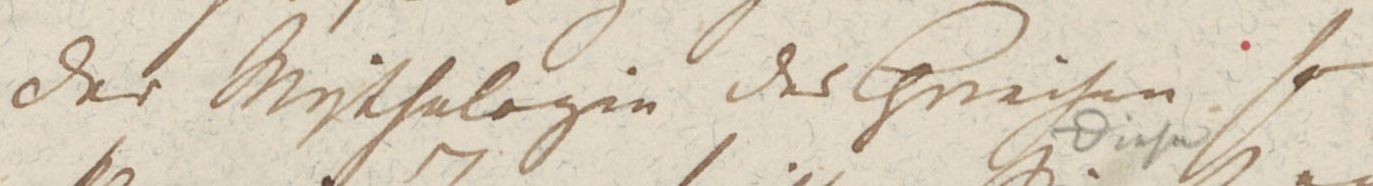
der Mythologie der Griechen so
